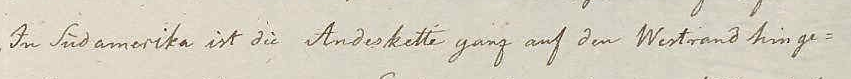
In Südamerika ist die Andeskette ganz auf den Westrand hinge-
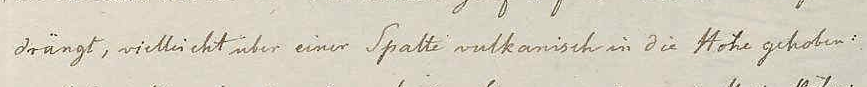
drängt, vielleicht über einer Spalte vulkanisch in die Höhe gehoben:
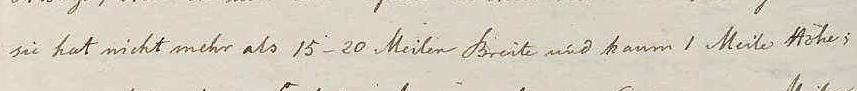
sie hat nicht mehr als 15–20 Meilen Breite und kaum 1 Meile Höhe;
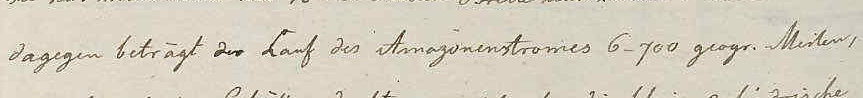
dagegen beträgt der Lauf des Amazonenstromes 6–700 geogr. Meilen,
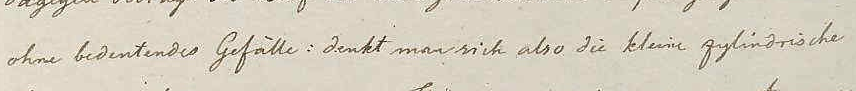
ohne bedeutendes Gefälle: denkt man sich also die kleine zylindrische
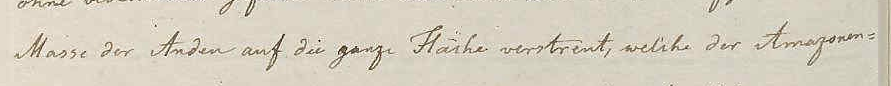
Masse der Anden auf die ganze Fläche verstreut, welche der Amazonen-
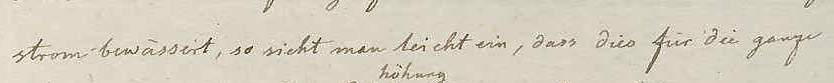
strom bewässert, so sieht man leicht ein, dass dies für die ganze
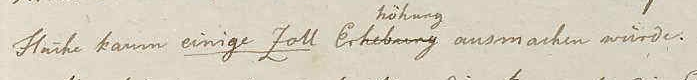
Fläche kaum einige Zoll Erhebunghöhung ausmachen würde.
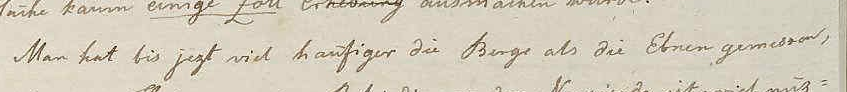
Man hat bis jezt viel häufiger die Berge als die Ebnen gemessen,
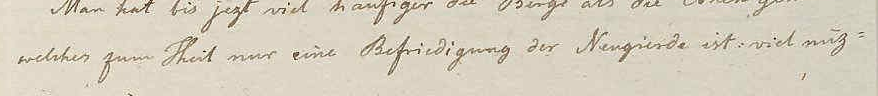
welches zum Theil nur eine Befriedigung der Neugierde ist: viel nüz-
